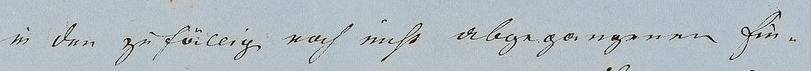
in den zufällig noch nicht abgegangenen Ein-
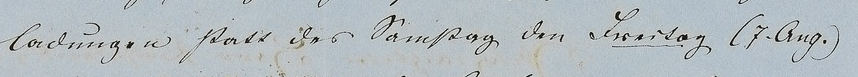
ladungen statt des Samstag den Freitag (7. Aug. )
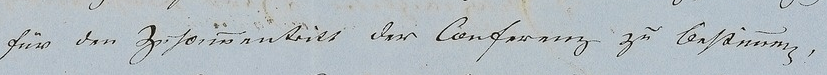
für den Zusammentritt der Conferenz zu bestimmen,
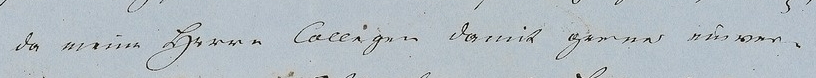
da meine Herrn Collegen damit gerne einver-
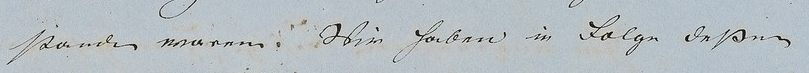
standen waren. Wir haben in Folge deßen
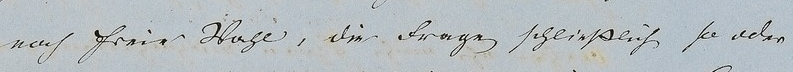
noch freie Wahl, die Frage schließlich so oder
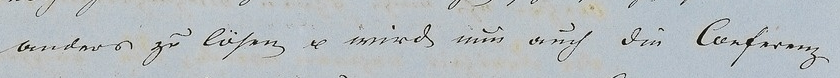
anders zu lösen & wird nun auch die Conferenz
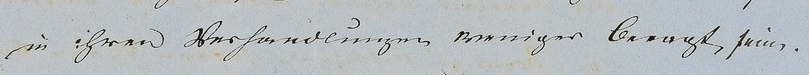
in ihren Verhandlungen weniger beengt sein.
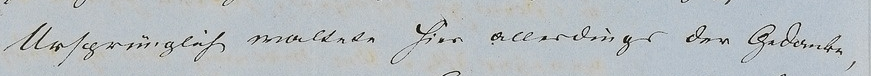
Ursprünglich waltete hier allerdings der Gedanke,
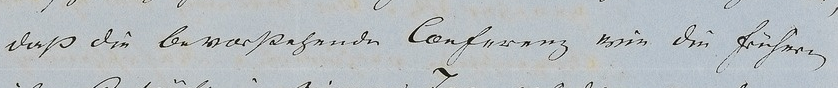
daß die bevorstehende Conferenz wie die frühern
